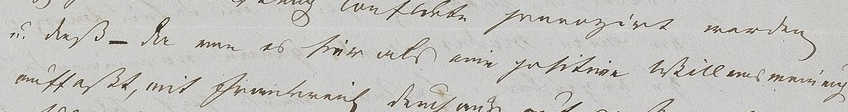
u. daß – da man es hier als eine positive Willensmeinung
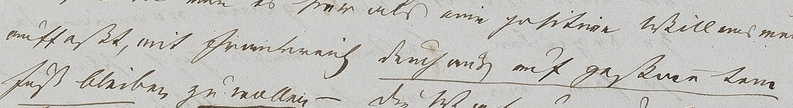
auffaßt, mit Frankreichdurchaus auf gespanntem
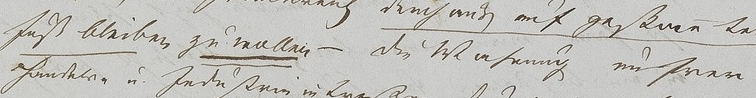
Fuß bleiben zu wollen – die Wahrung unsrer
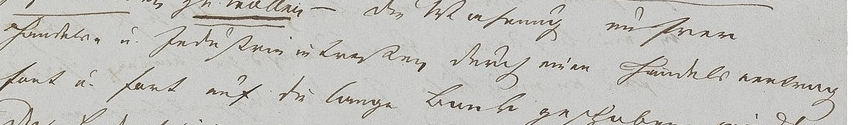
Handels- u. Industrieintreßen durch einen Handelsvertrag
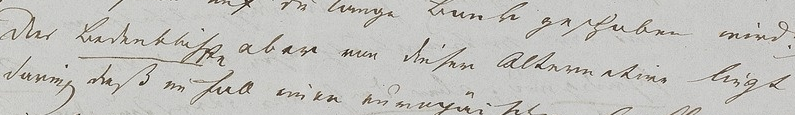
Das Bedenklichste aber von dieser Alternative liegt
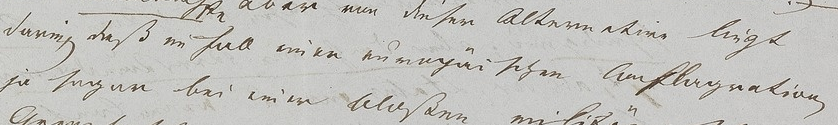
darin, daß im Fall einer europäischen Conflagration
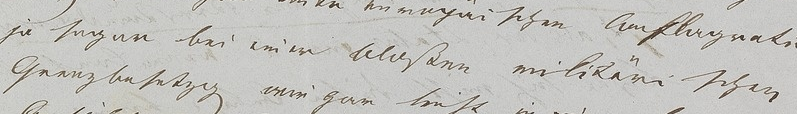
ja sogar bei einer bloßen militärischen
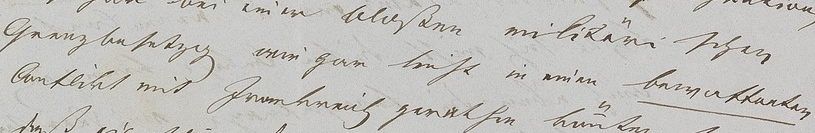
Grenzbesetzg wir gar leicht in einen bewaffneten
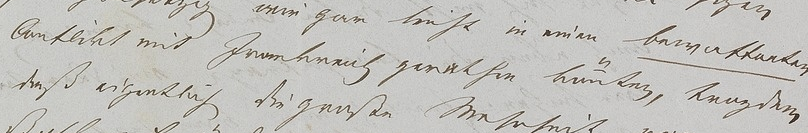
Conflikt mit Frankreich gerathen könnten, trozdem
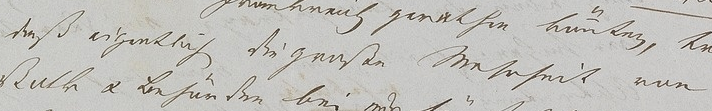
daß eigentlich die große Mehrheit von
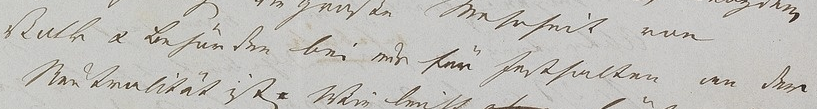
Volk & Behörden bei uns für Festhalten an der
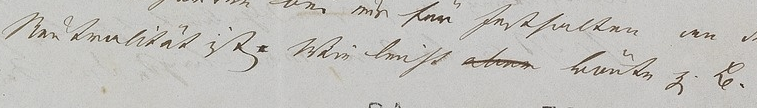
Neutralität ist. Wie leicht aber könnte z.
